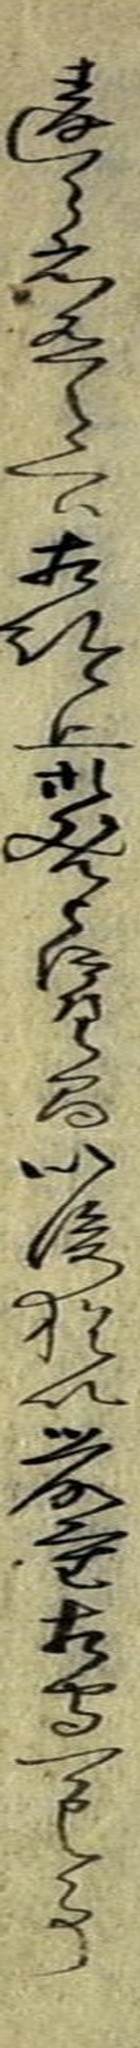違之者有之候へは相糺候上御咎被仰付候間以後猶以厳重相守可申候事
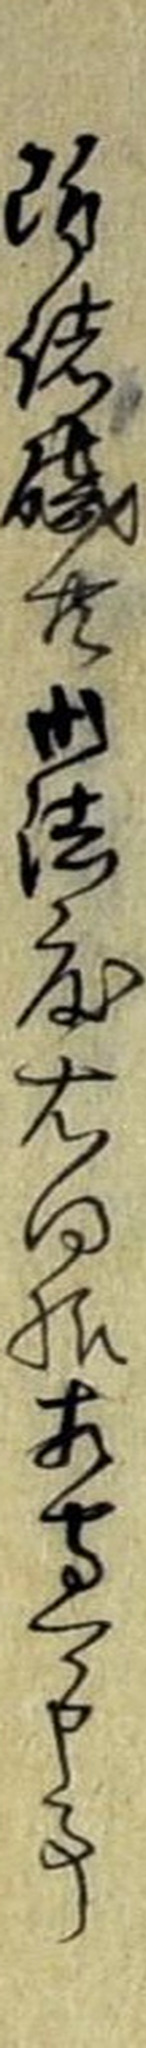附諸職共御法度右同様相守可申事
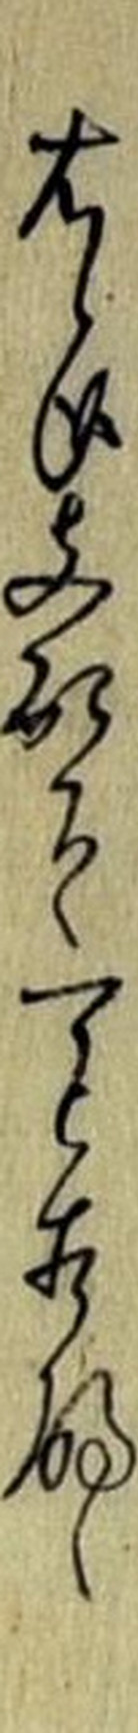右之趣支配下へ可被相触候
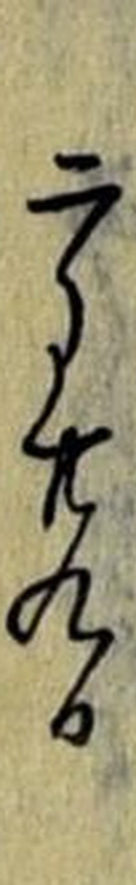二月廿九日
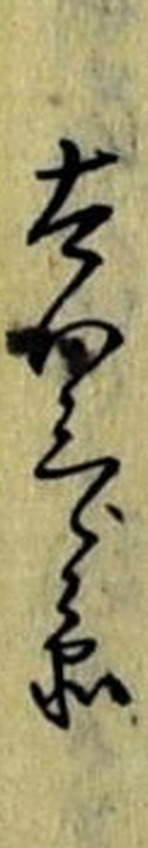太田三郎兵衛
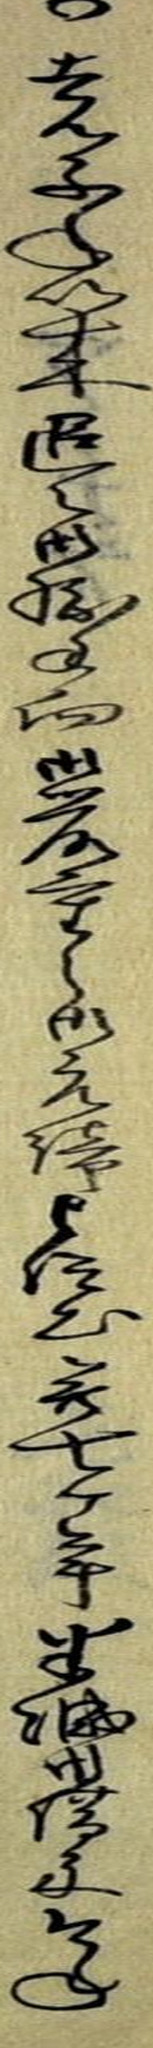○去子年以来追々御勝手向御厳重之御取締被仰出并七ヶ年半減御借米今年
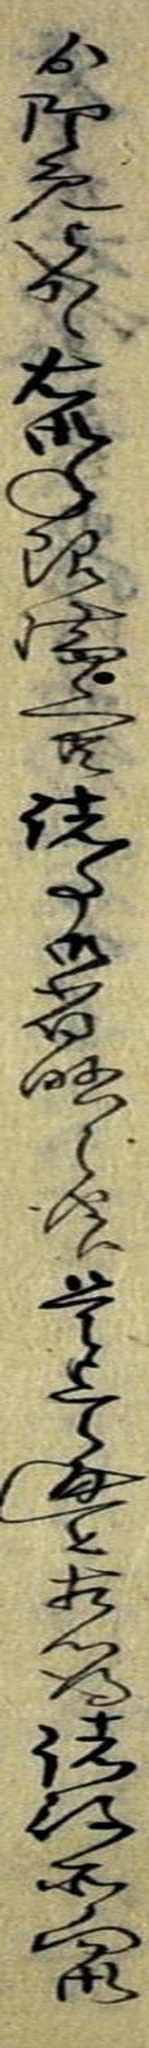ゟ御免被成候右御年限満候へ共諸事御省略之儀は是迄之通と相心得諸役所向御
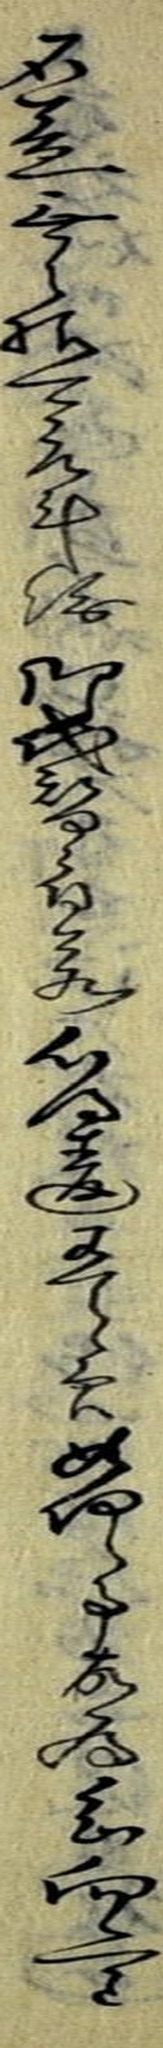不益無之様可取斗儀御代替に付若心得違有之候而は如何之事故為念向へ被
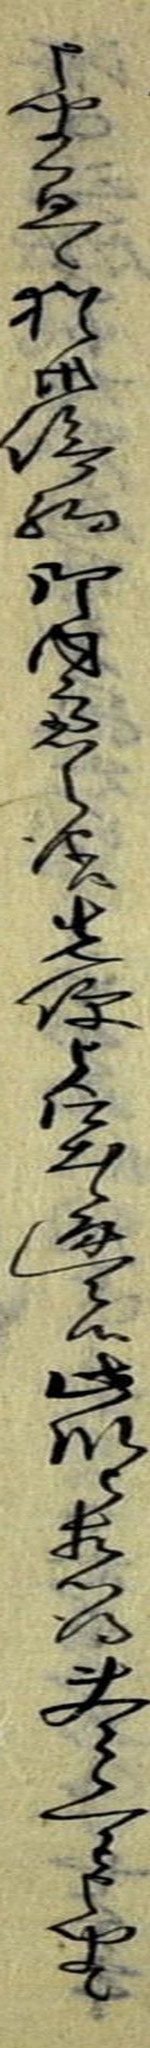申聞置候猶御倹約御内慮之儀は先評被仰出候通に候此段被相心得夫々可被申聞候
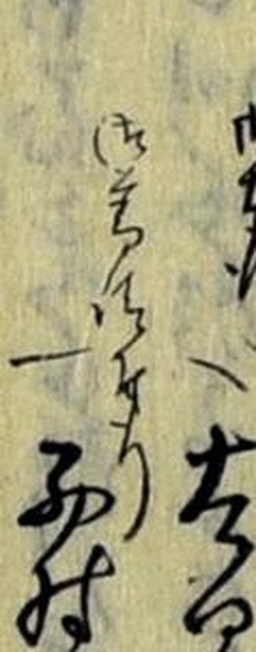御作事奉行
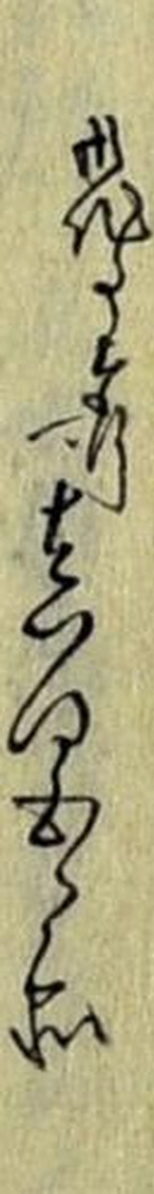御作事奉行真田五兵衛
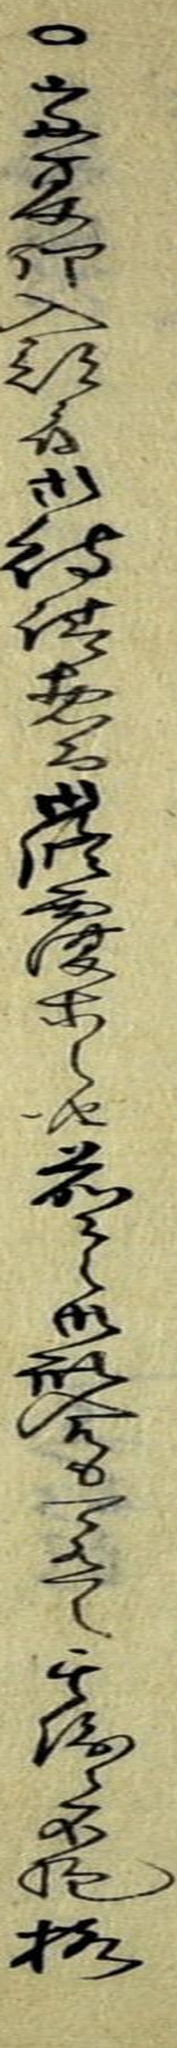○当夏御入部に付御待請惣而御修覆等之儀前々之御形合も可有之其儀に不拘格
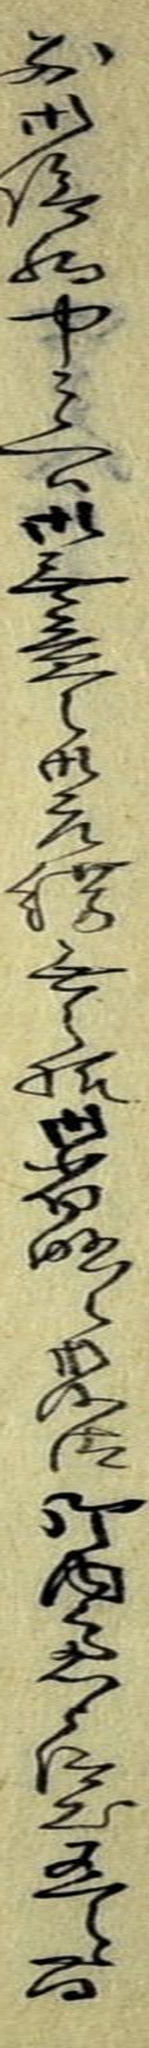別御倹約中に候へは御無益之御取錺無之様御省略之御沙汰御内慮被仰出有之候間
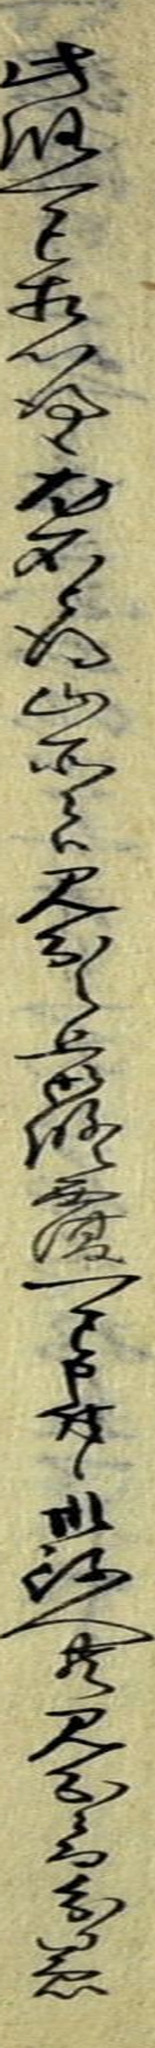此段可被相心得候尤不被得止所には見分之上御修覆可被申付候御役人共見分候而分り兼
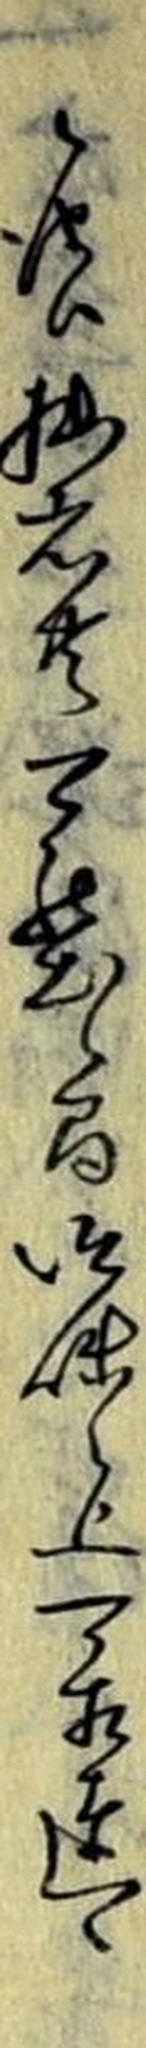候儀は拙者共可罷出候間吟味之上可相達候
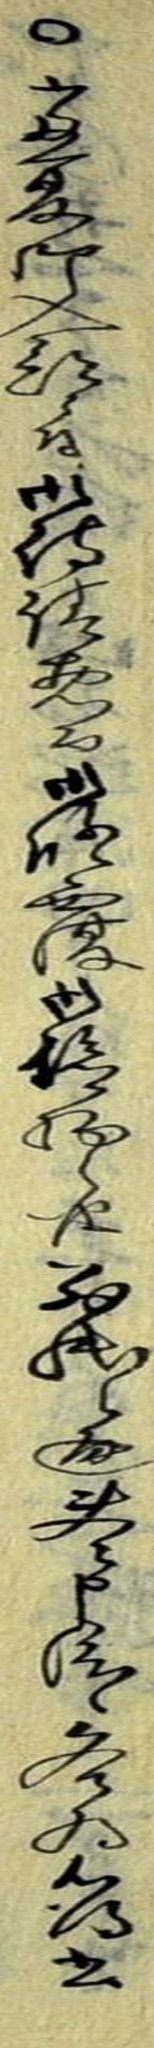○当夏御入部に付御待請惣而御修覆御倹約之儀別紙之通夫々申渡候各為心得書
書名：命令之部 四
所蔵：福井県文書館 Fukui Prefectural Archives
